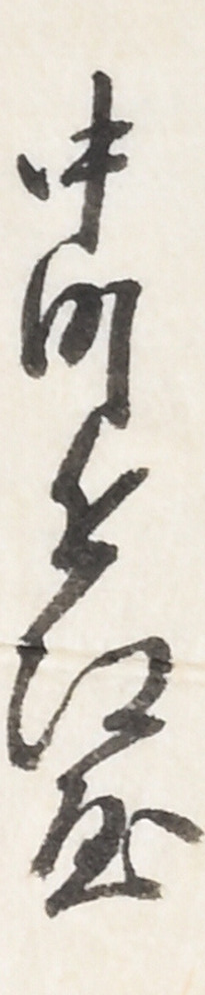中町近江屋
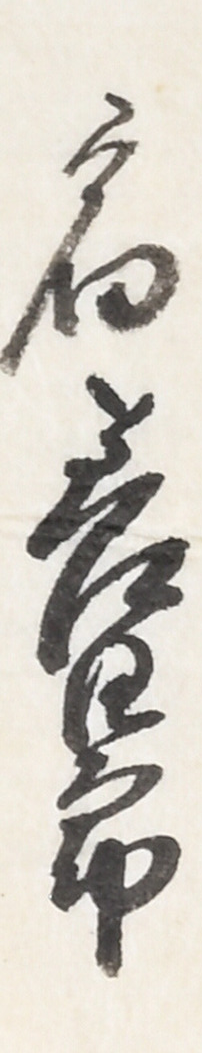宿善四郎
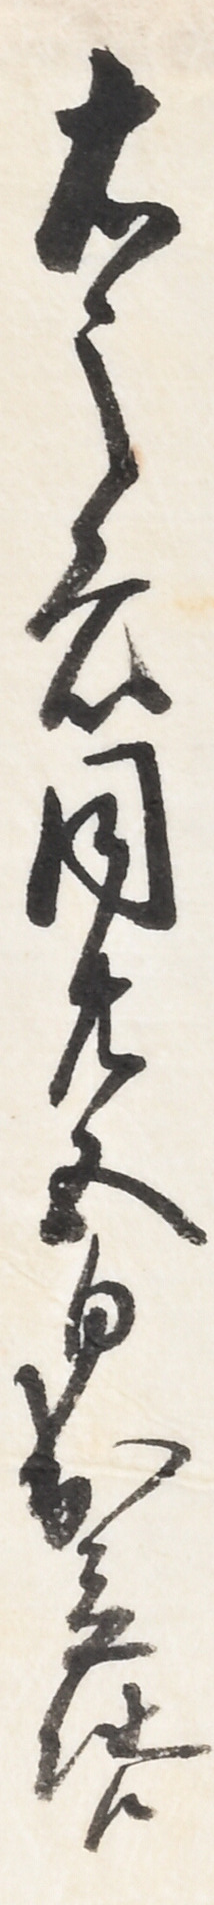右之者同廿五日出立仕候
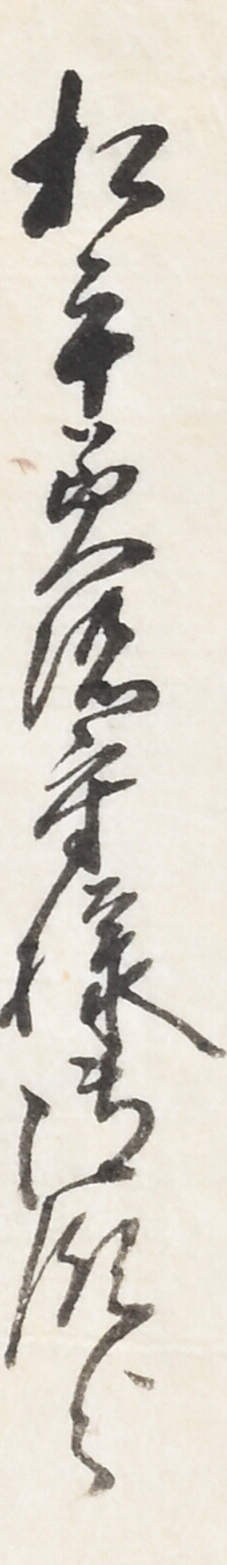松平美濃守様御領分
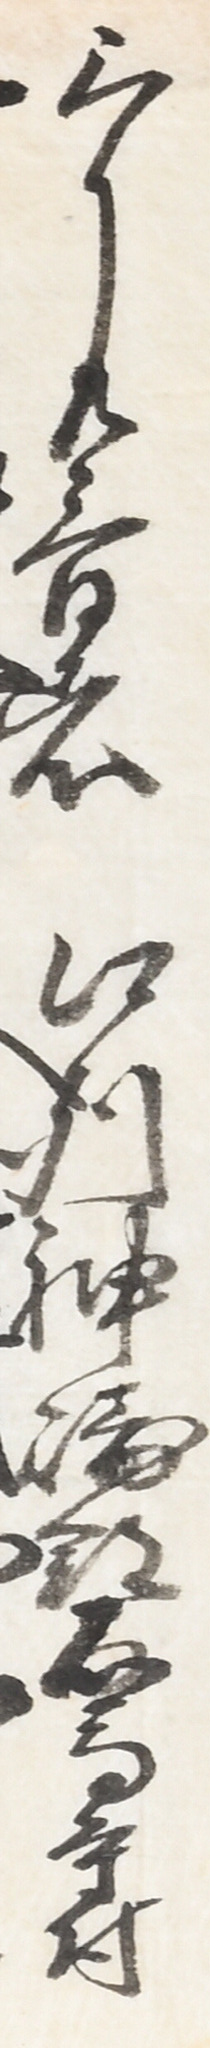三月廿三日着江州神崎郡石馬寺村
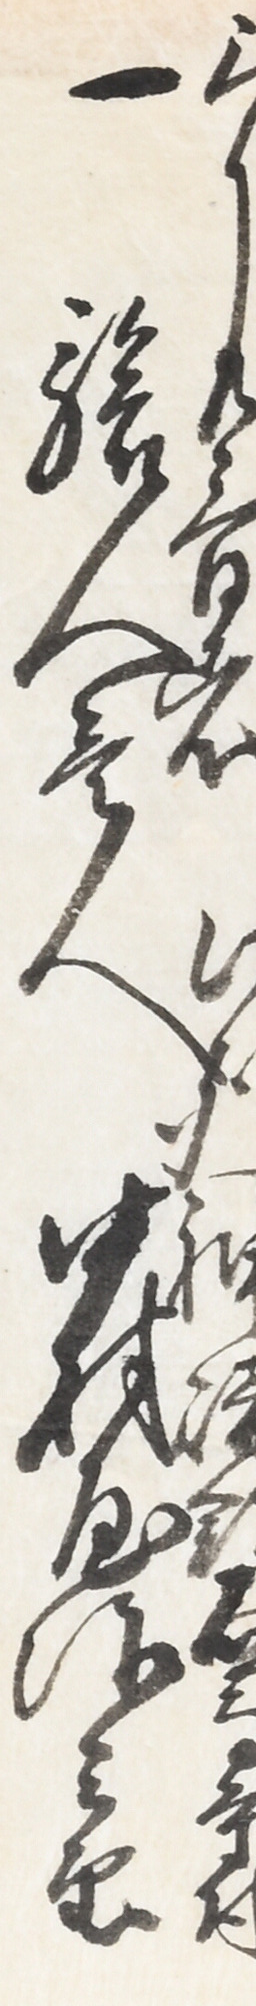一旅人壱人中村屋治兵衛
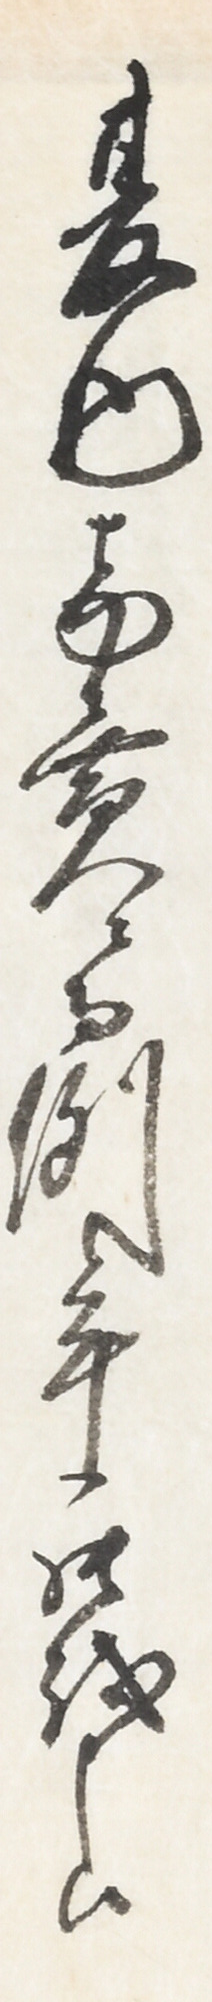夏内商売ニ而例年罷越申候
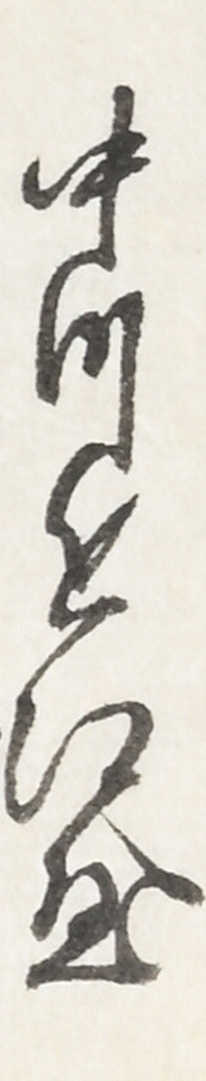中町近江屋
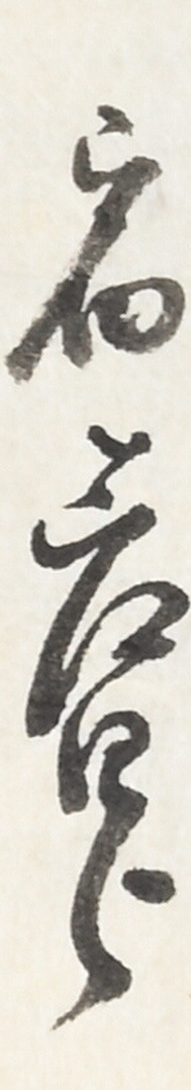宿善四郎
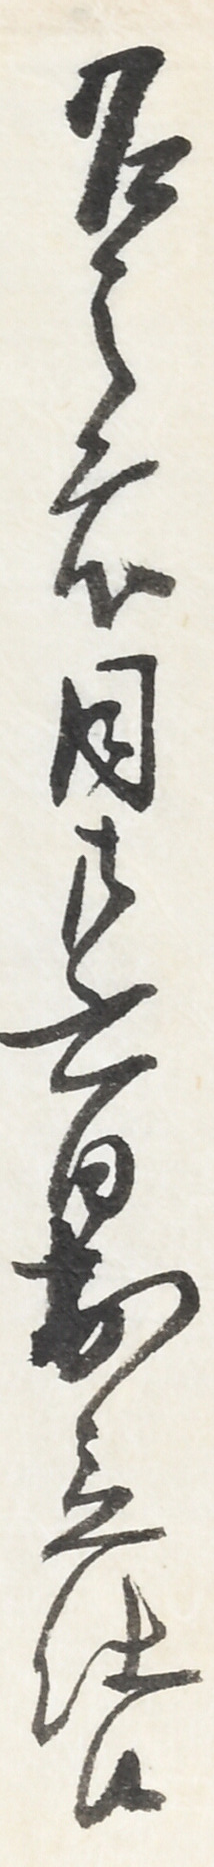右之者同廿六日出立仕候
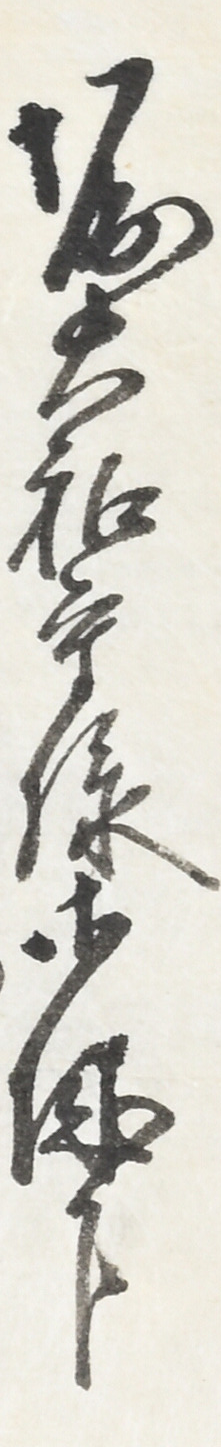堀大和守様御城下
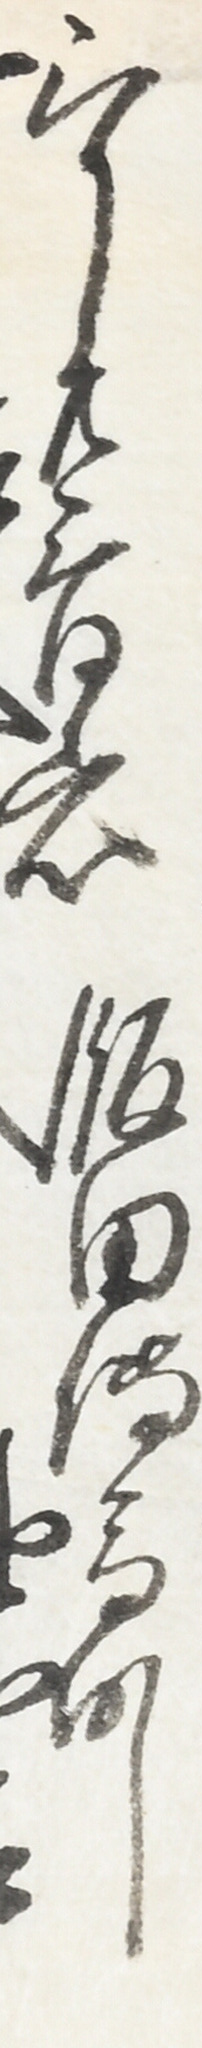三月廿三日着飯田伝馬町
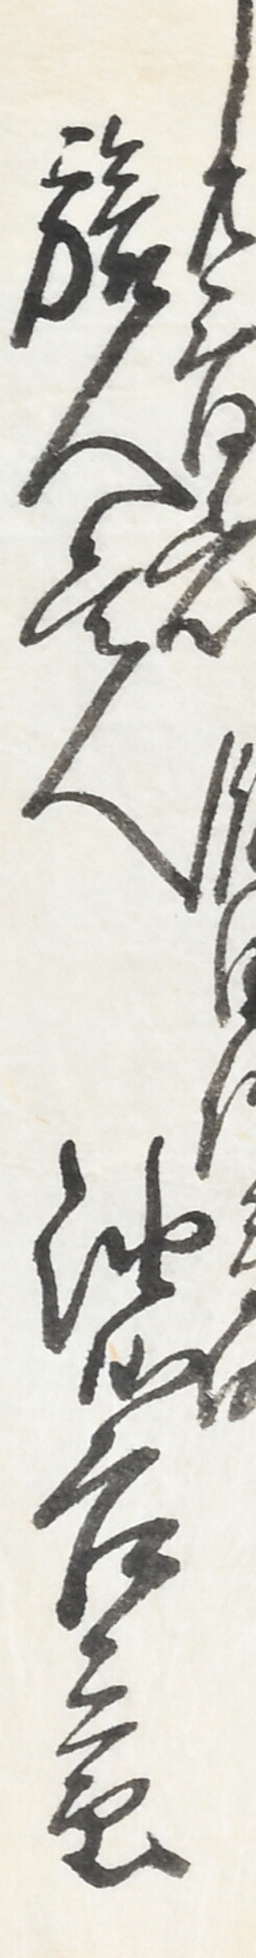一旅人壱人油や吉兵衛
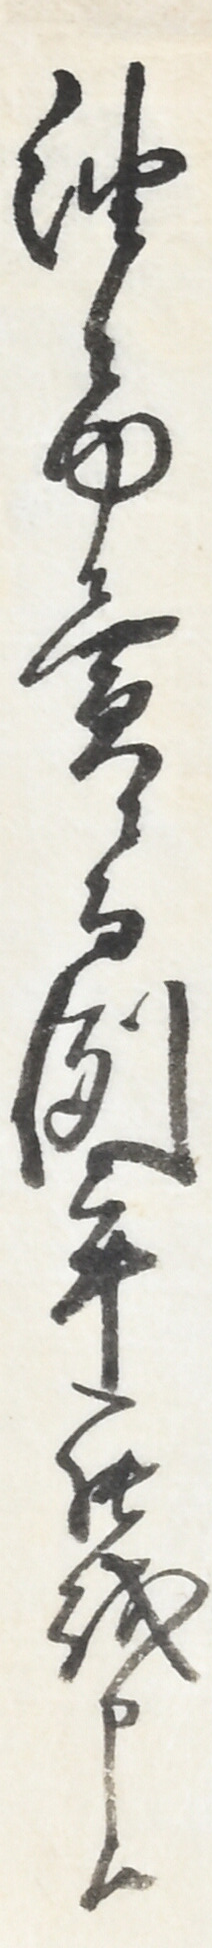油商売ニ而例年罷越申候

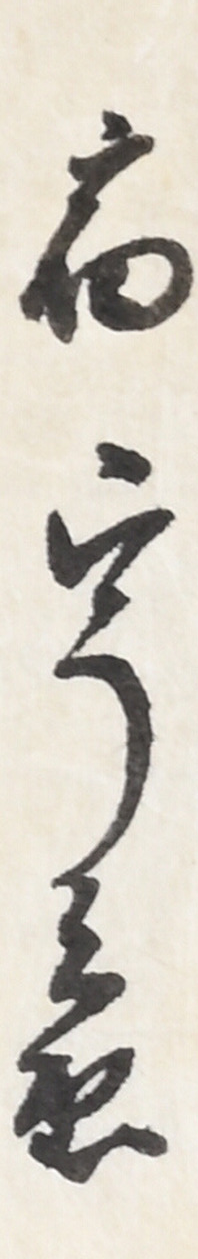宿宇兵衛
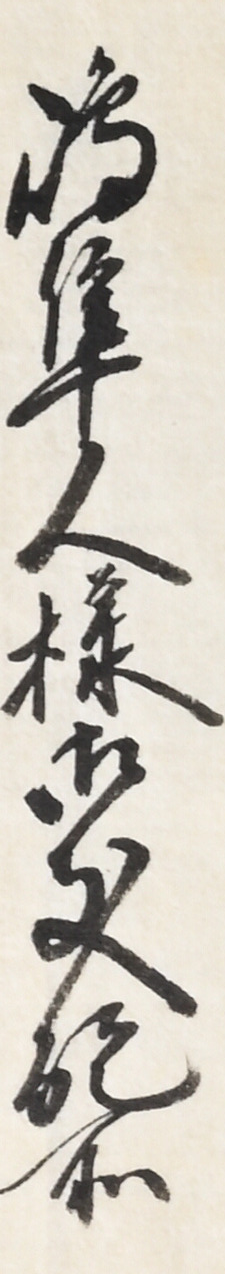嶋隼人様御支配所
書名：旅人泊控帳
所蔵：伊那市立高遠町図書館・合同会社AMANE
